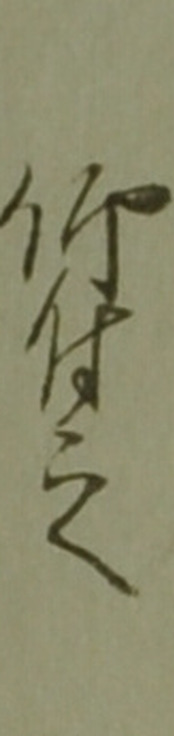仰付之
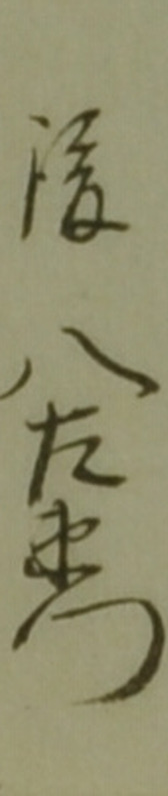後八左衛門
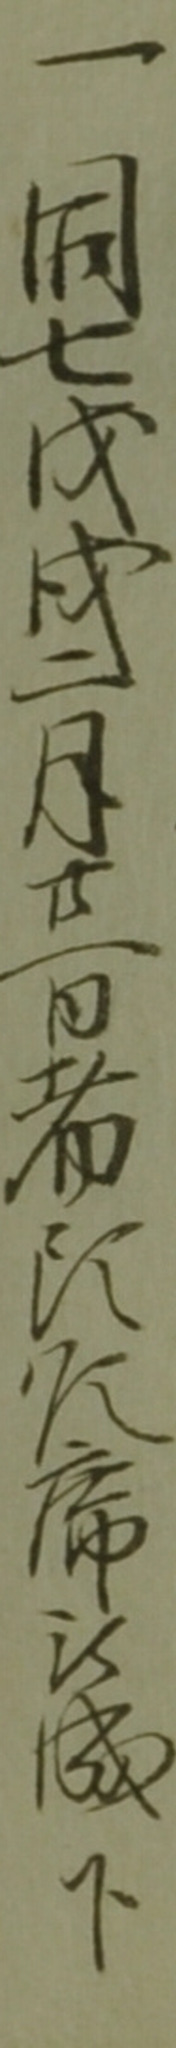一同七戊戌二月廿一日者頭次席被成下
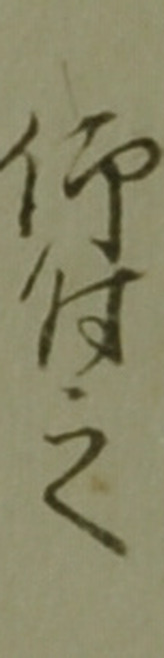仰付之
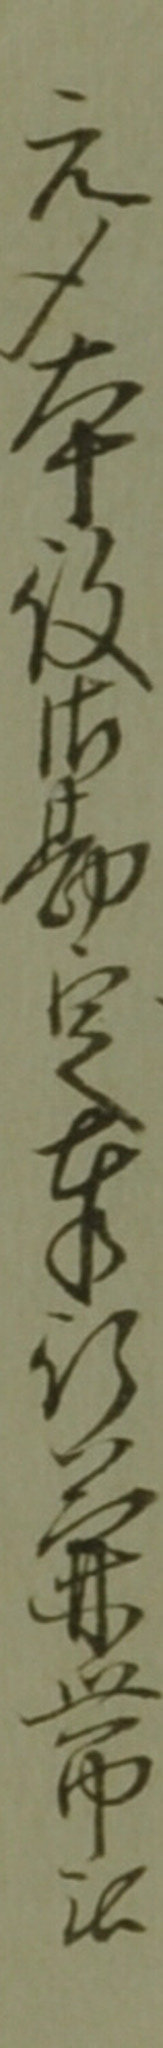元〆本役御勘定奉行兼帯被
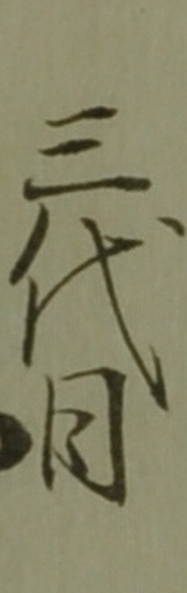三代目
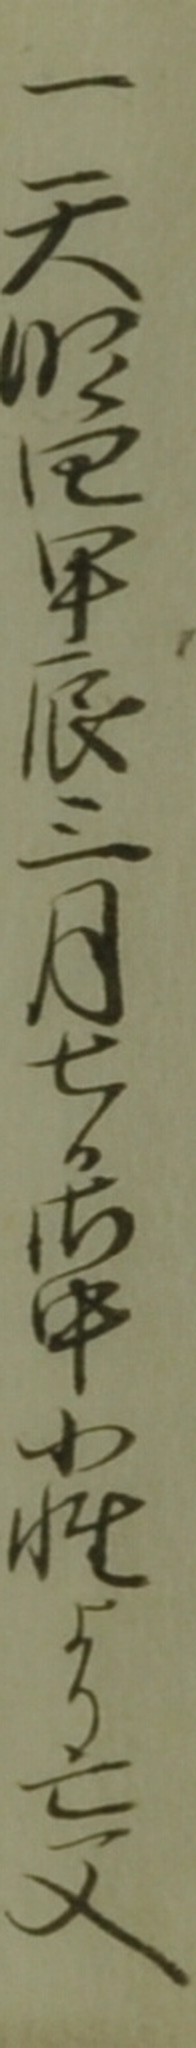一天明四甲辰三月七日御中小性より亡父
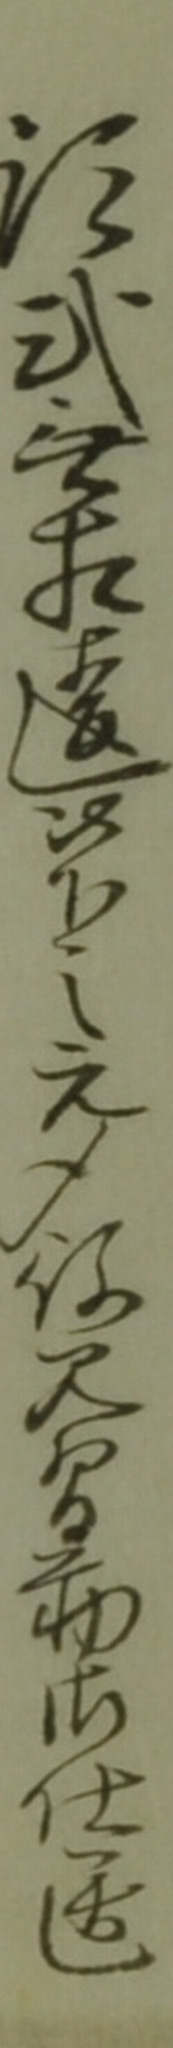跡式無相違被下之元〆役見習勤御仕置
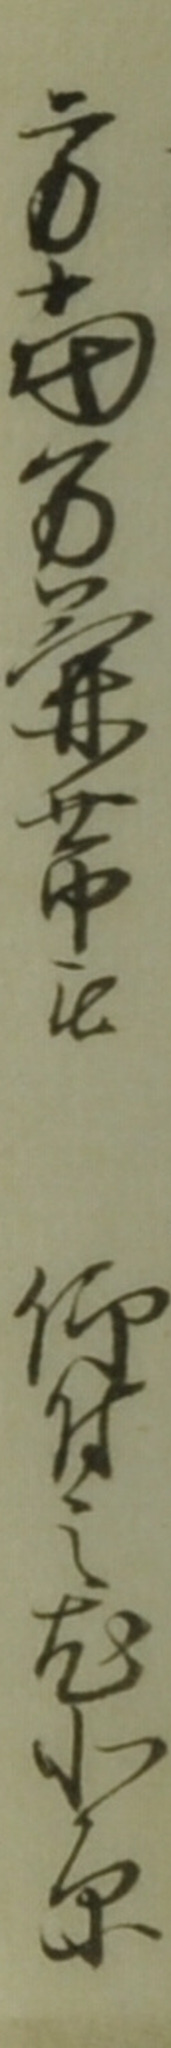方当方兼帯被仰付之尤小原
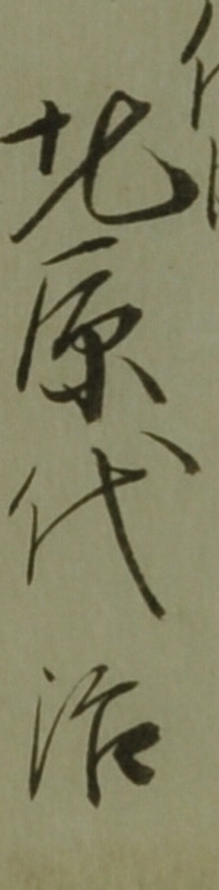北原代治

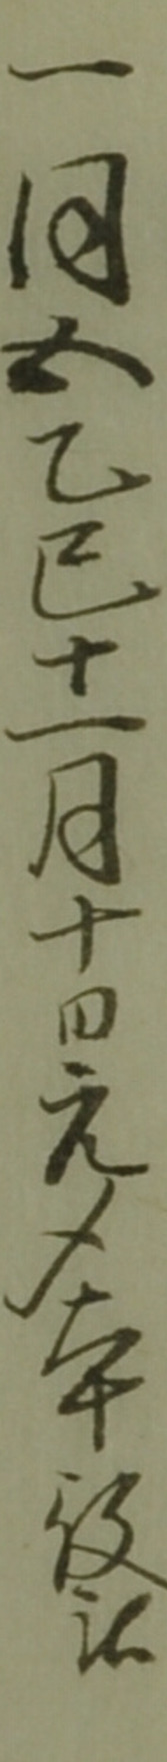一同五乙巳十一月十日元〆本役被
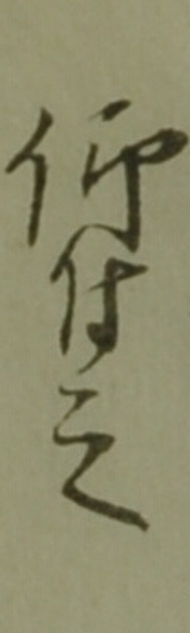仰付之
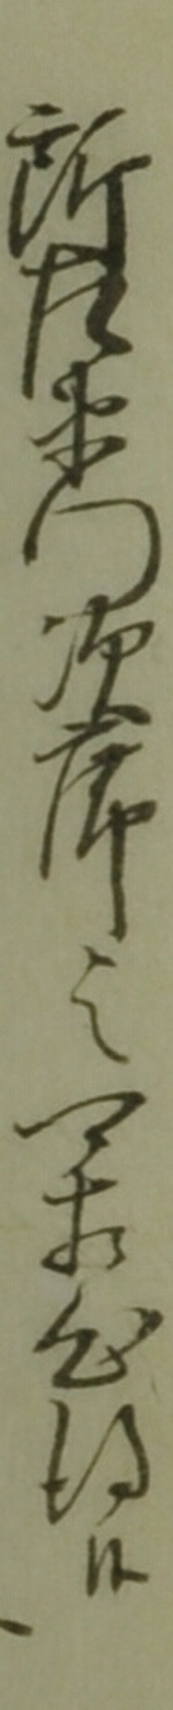所左衛門次席令可相心得候
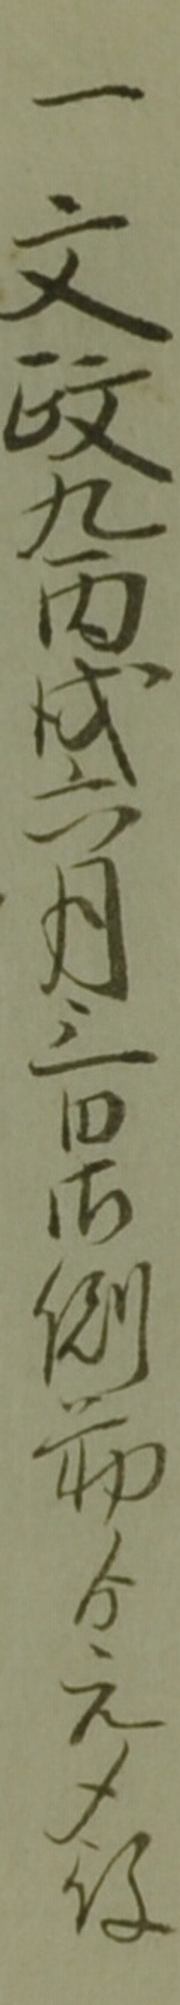一文政九丙戌六月三日御側勤ゟ元〆役
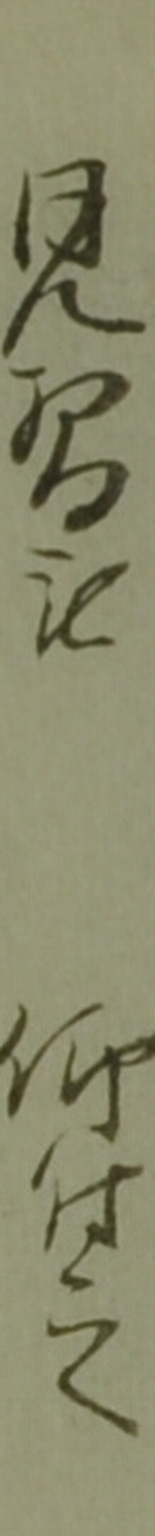見習被仰付之
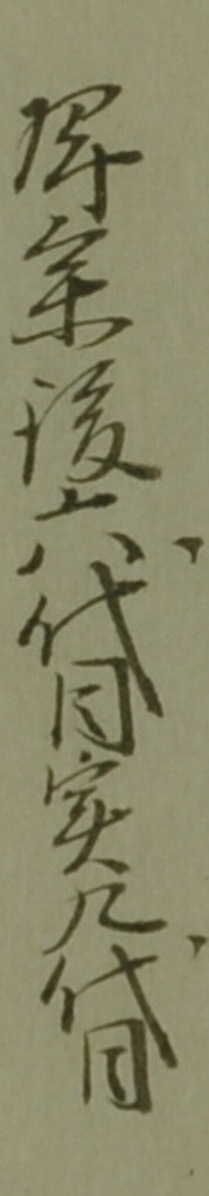帰参後六代目実九代目
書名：諸御役代々録（七）
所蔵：伊那市立高遠町図書館・合同会社AMANE
